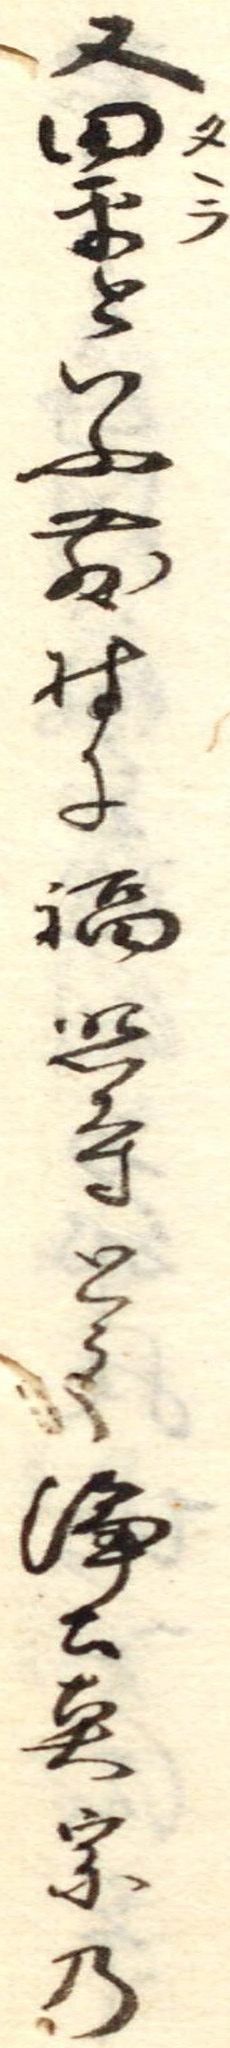又田平といふ散村に福照寺とて浄土真宗の
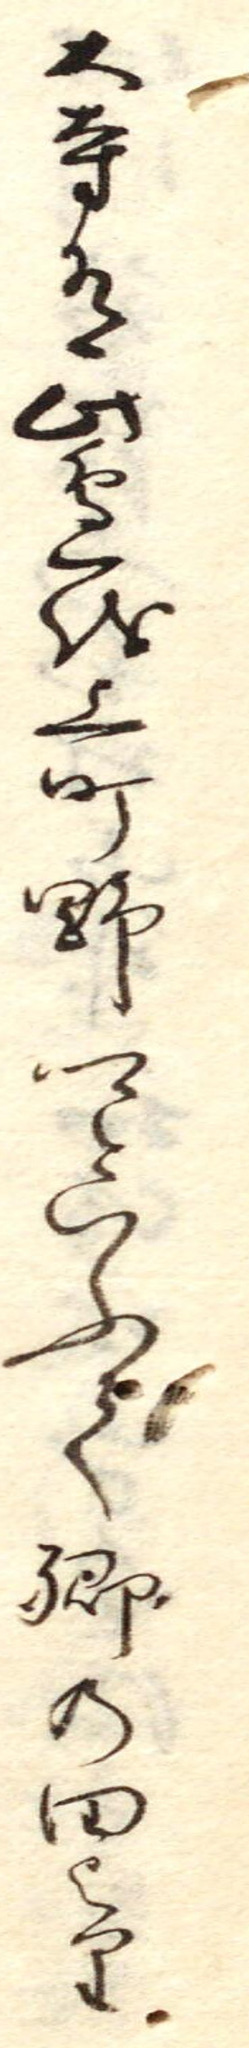大寺有此辺を上町野郷といふて郷の田より
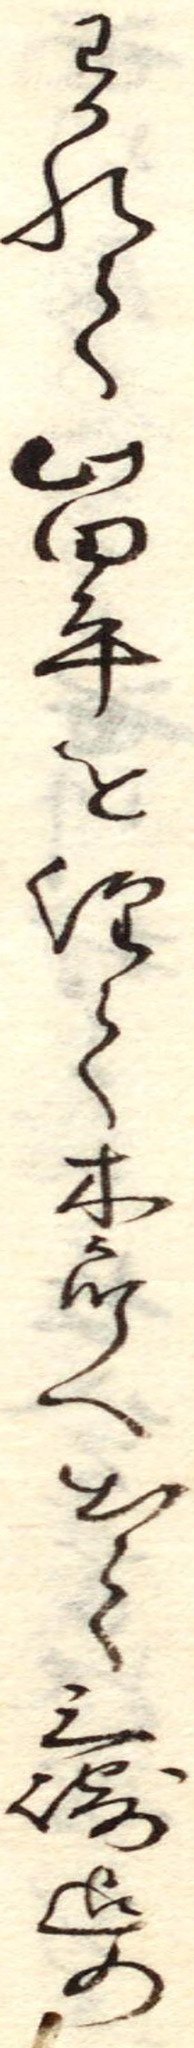わかれて此田平を経て木郎へ出て三崎迄の
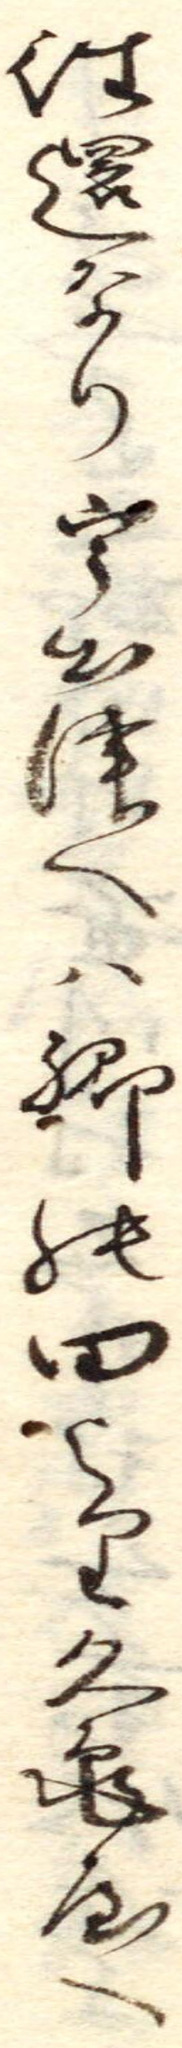往還なり宇出津へは郷の田より久亀屋へ
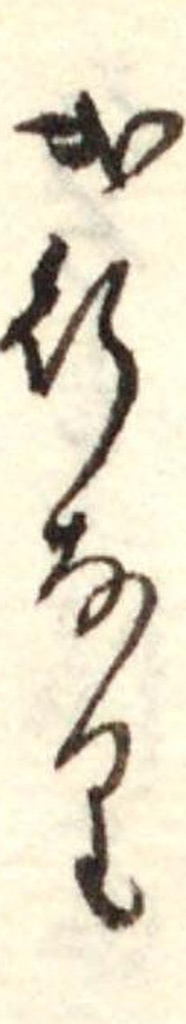出行なり
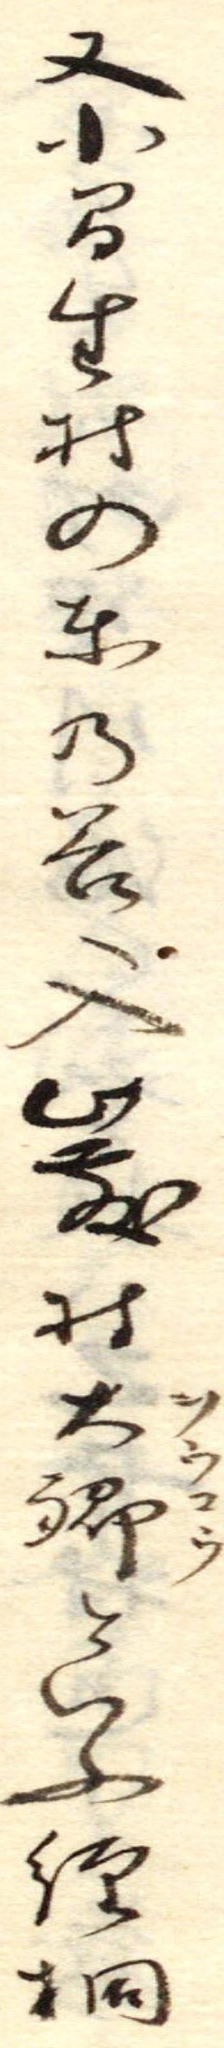又小間生村の東の谷へ入此の散村大郷といふ経桐
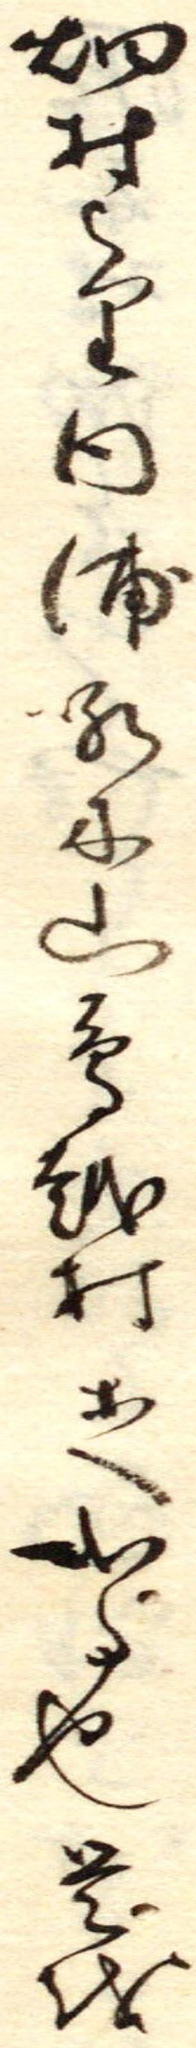畑村より内浦水木山鳥越村等へ出る也是を

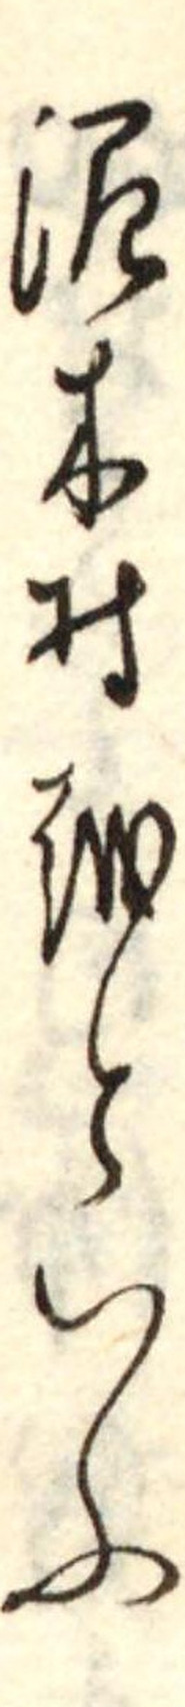泥木村越といふ
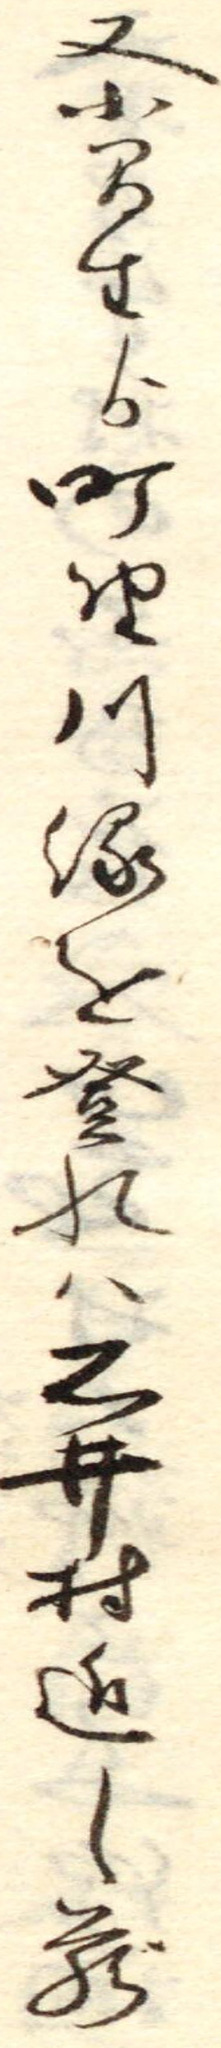又小間生ゟ町野川縁を登れは公井村近し蔵
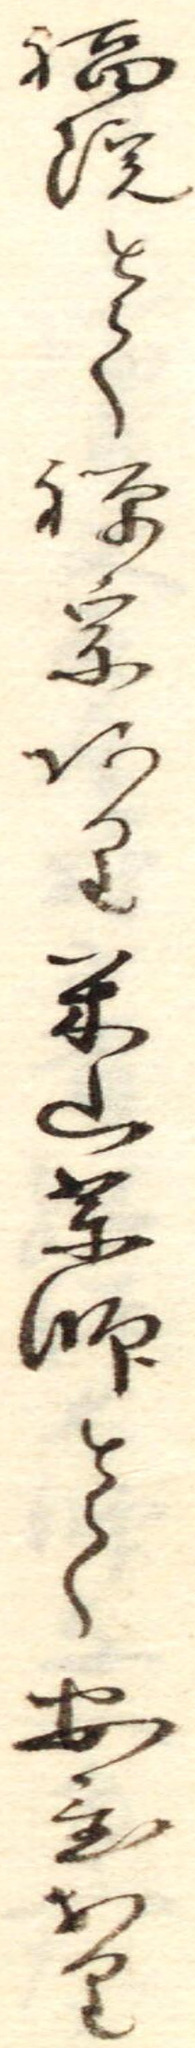福院とて禅宗あり米山薬師とて安置あり
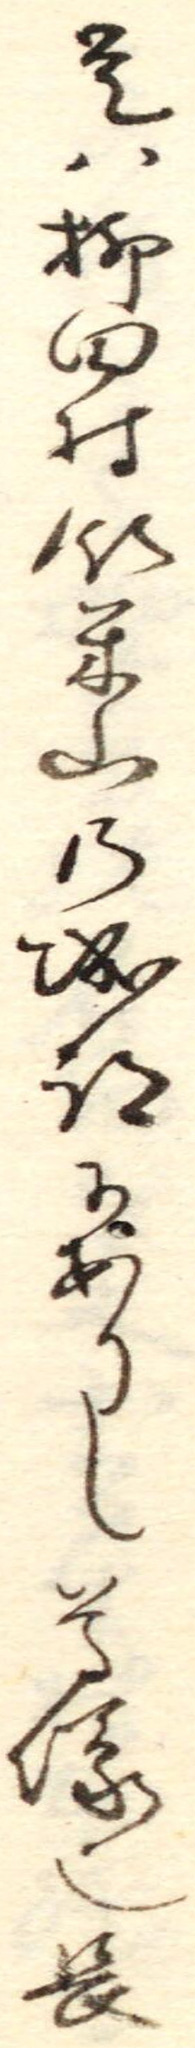是は柳田村領米山の城跡にありし尊像也長
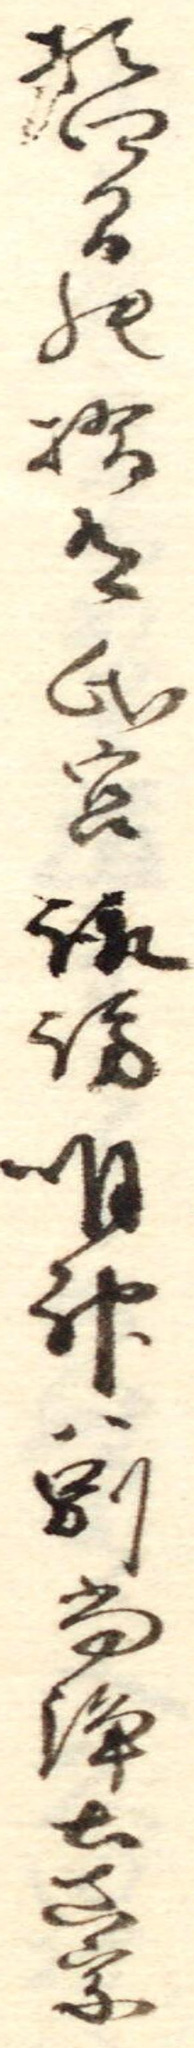拾四間の橋有氏宮諏訪明神は別当浄土真宗
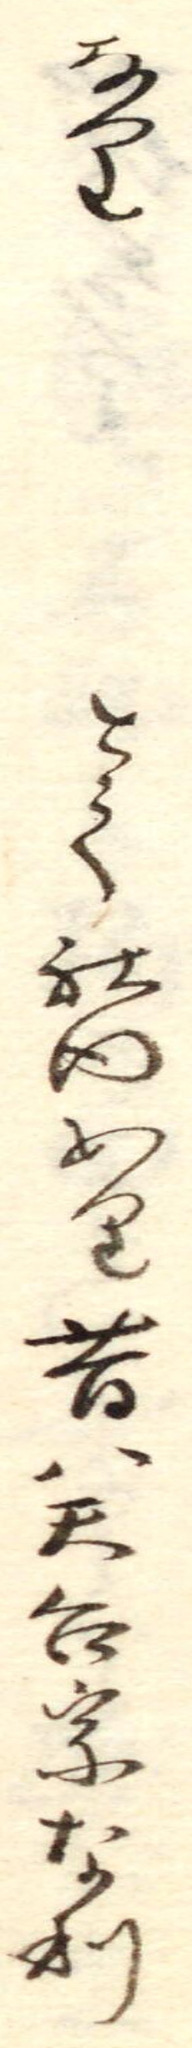なりとて社内あり昔は天台宗なり
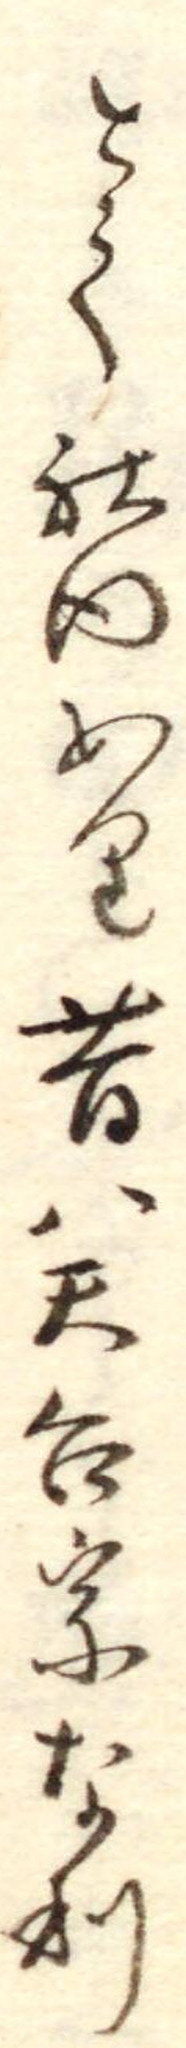なりとて社内あり昔は天台宗なり
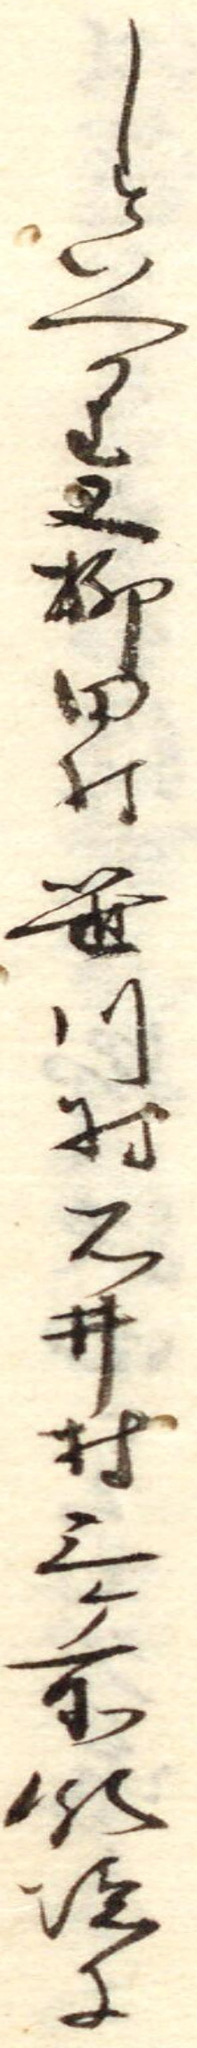しといへり又柳田村笹川村石井村三ヶ所領境に
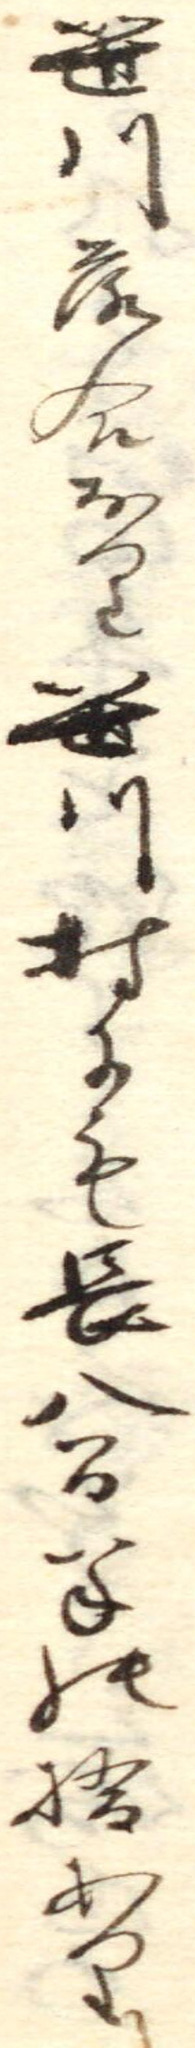笹川落合なり笹川村にも長八間半の橋あり
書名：能登名跡誌
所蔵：Ishikawa Prefectural Library
